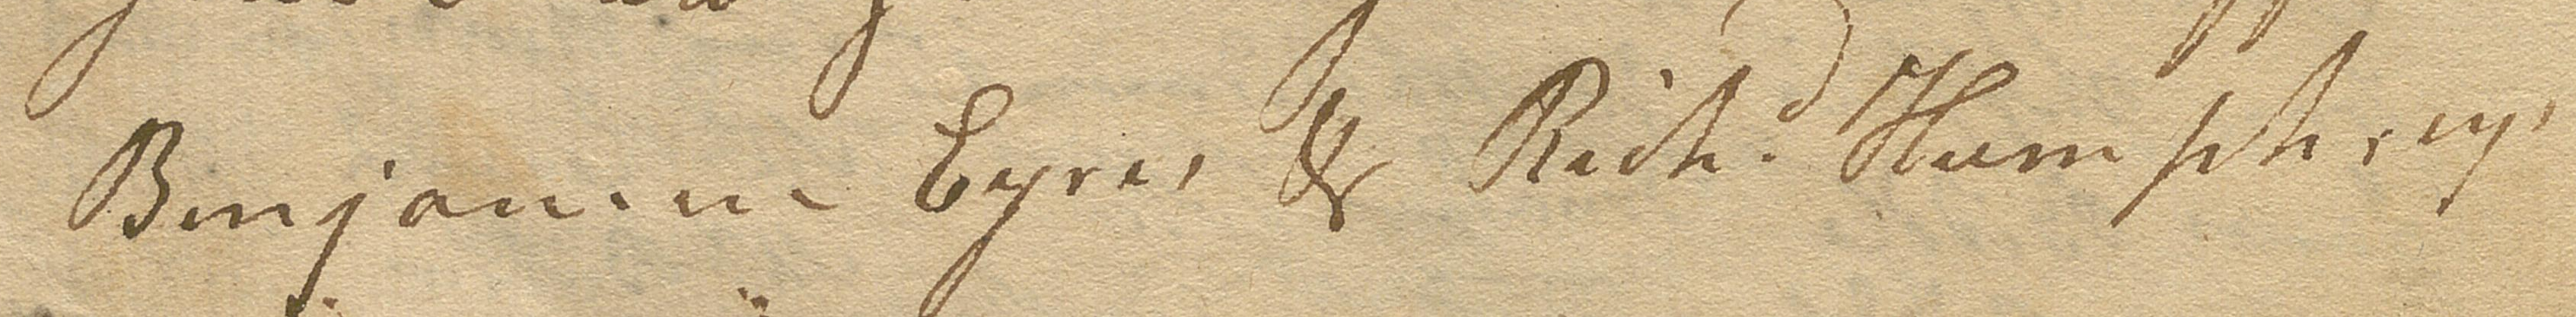Bengaiine Eyres & Rich^d. Humphreys
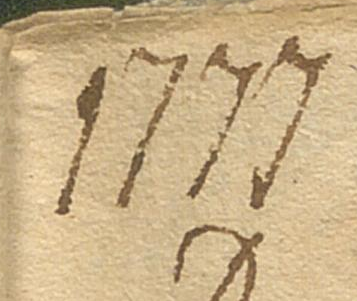1777
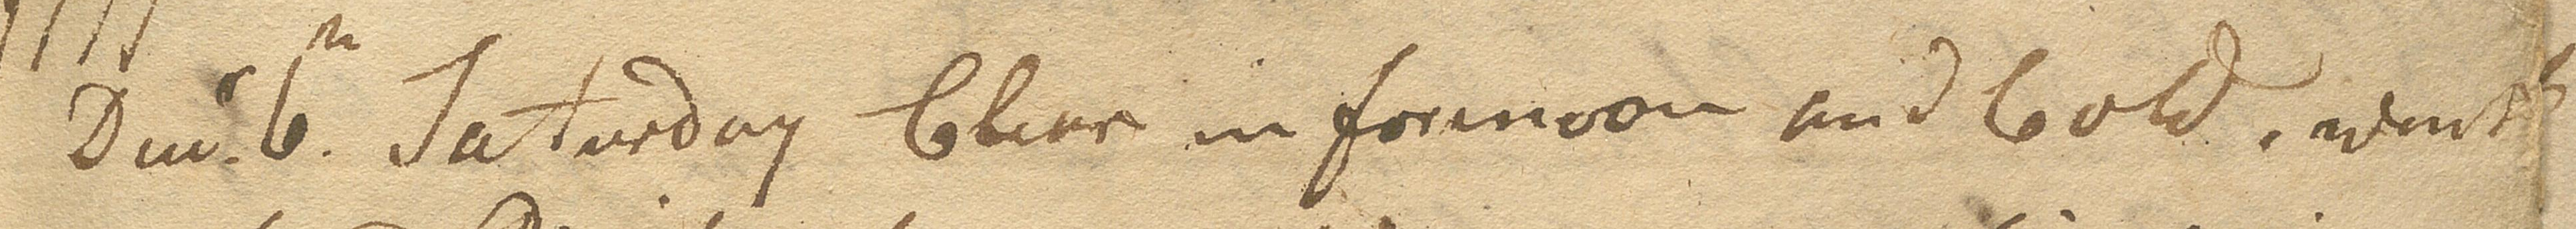Dec^r. 6^th. Saturday Clear in forenoon and Cold, went
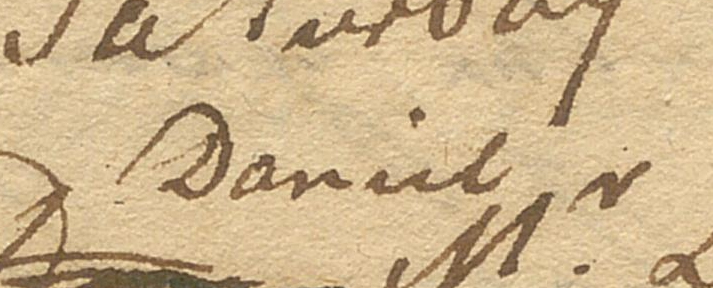Daniel
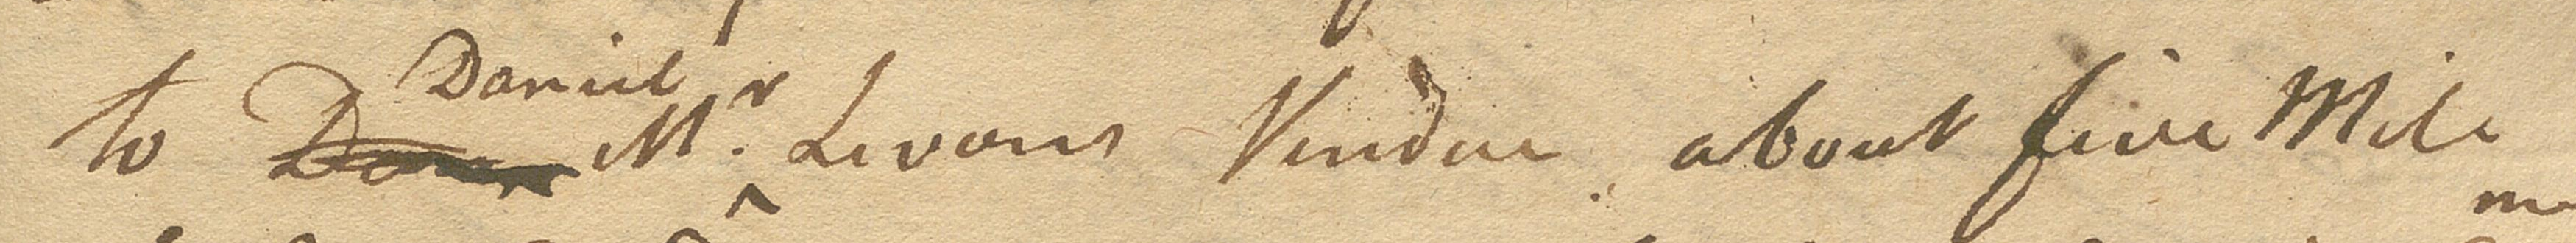to [Decer] M^r. ^ Levans Vendue about five Mile
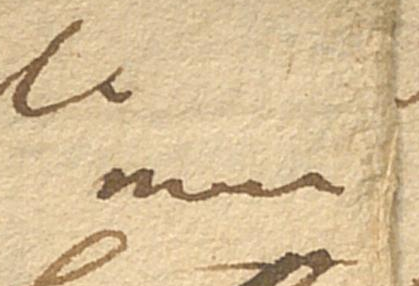men
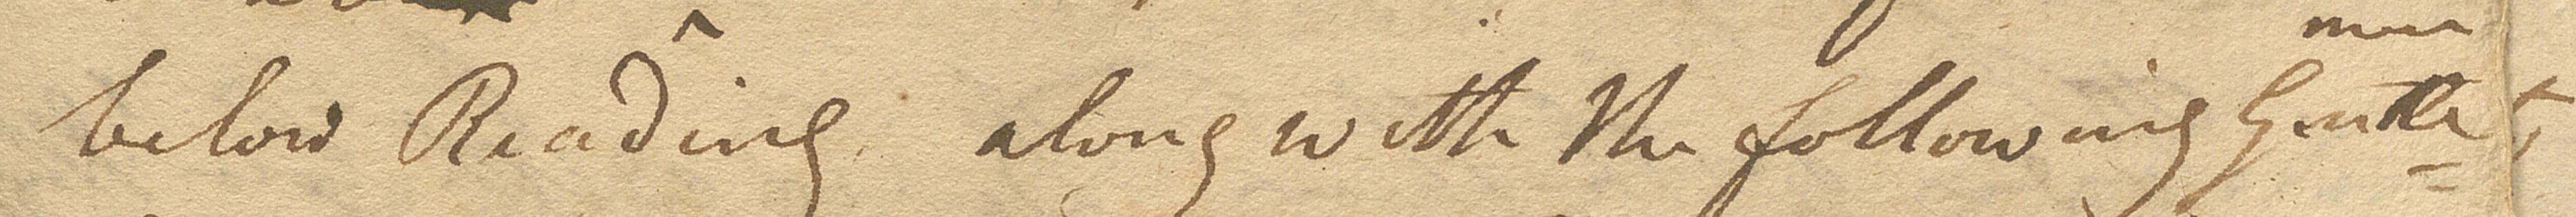below Reading along with the following Gentle
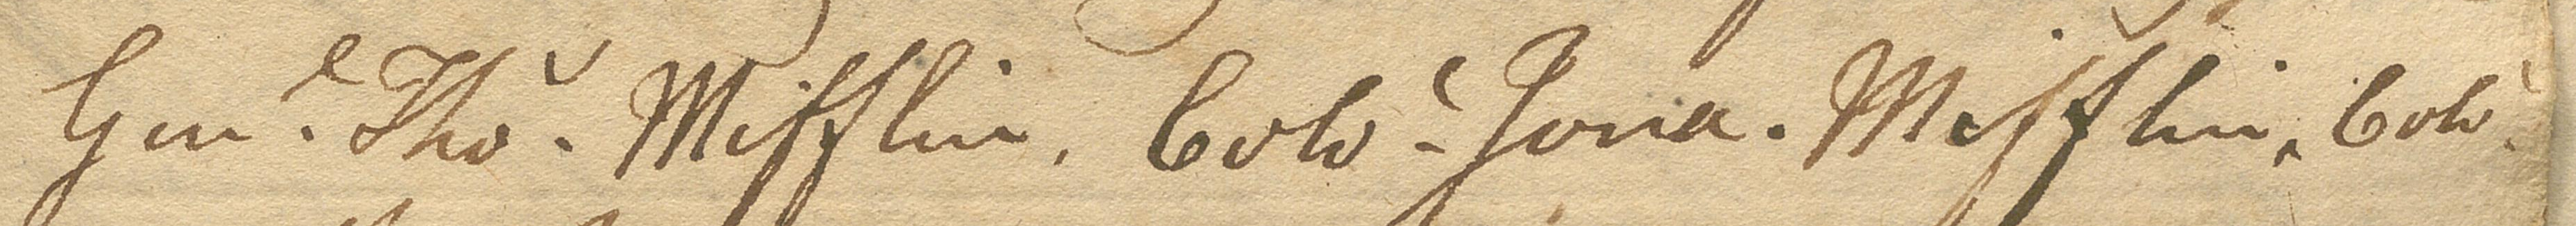Gen^l. Tho^s. Mifflin, Colo^l. Jona. Mifflin, Colo^l.
